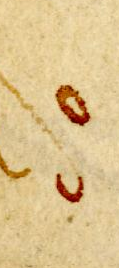To
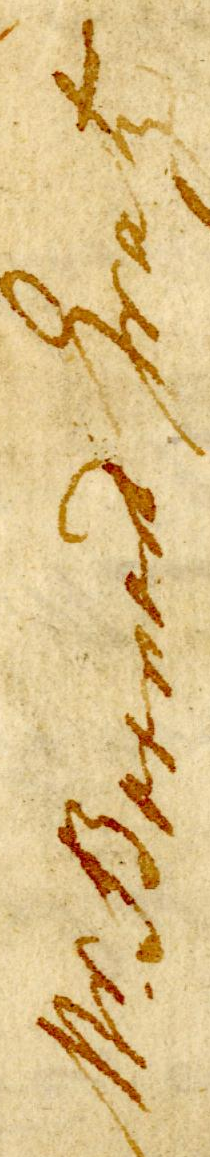M^r. Barnard Gratz
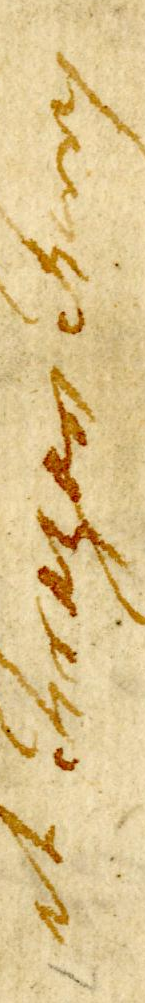at Frazers Ferry
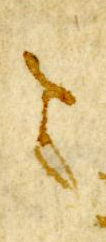at
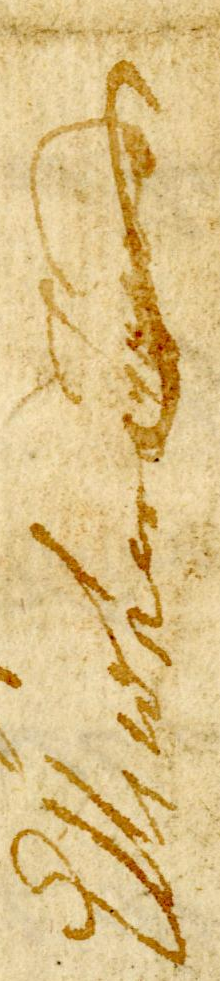Williamsburg
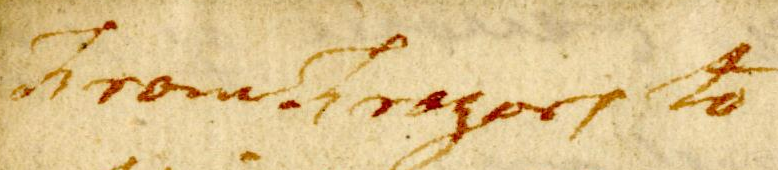From Frazers to
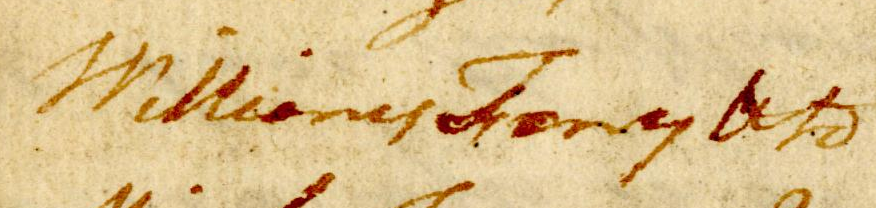Williams Ferry & to
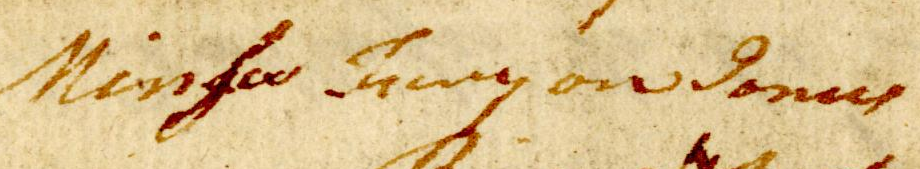Minfa ferry on James
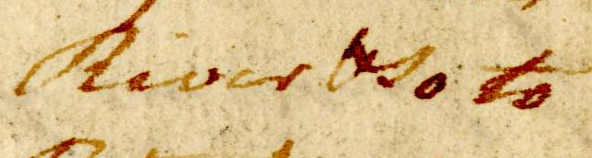River & so to
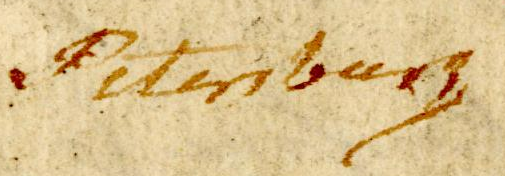Petersburg
